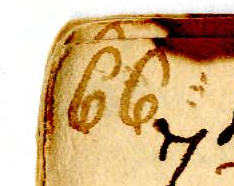66
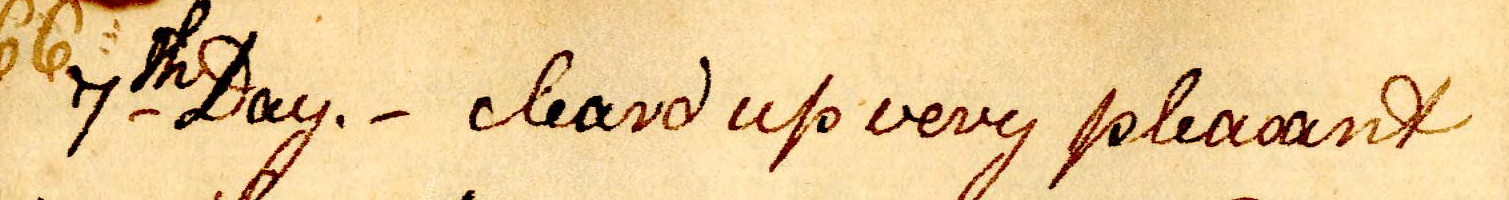7^th Day- cleard up very pleasant
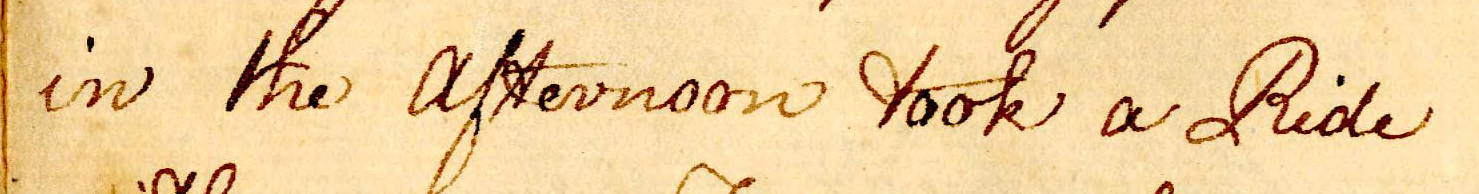in the Afternoon took a Ride
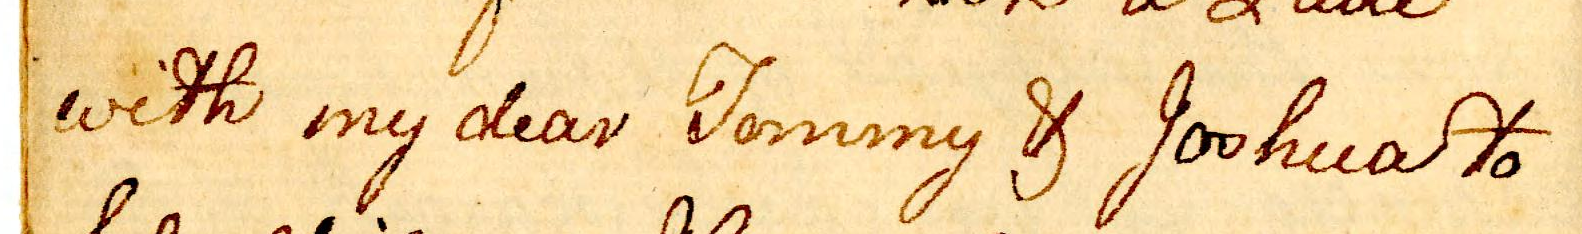with my dear Tommy & Joshua to
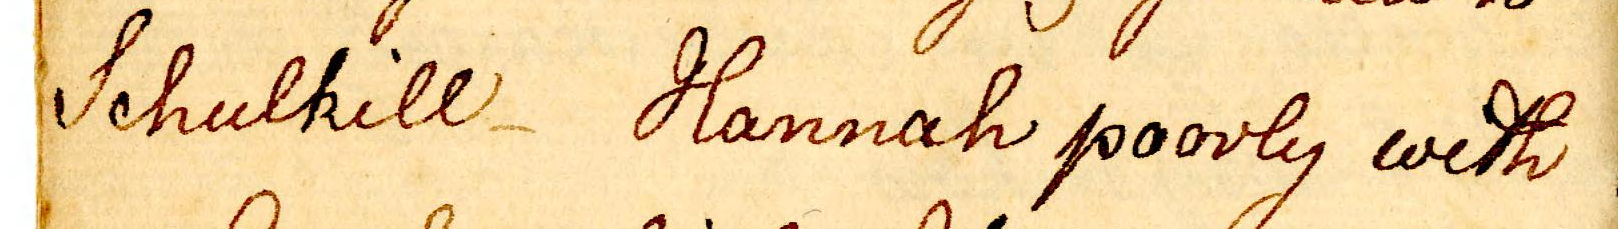Schulkill- Hannah poorly with
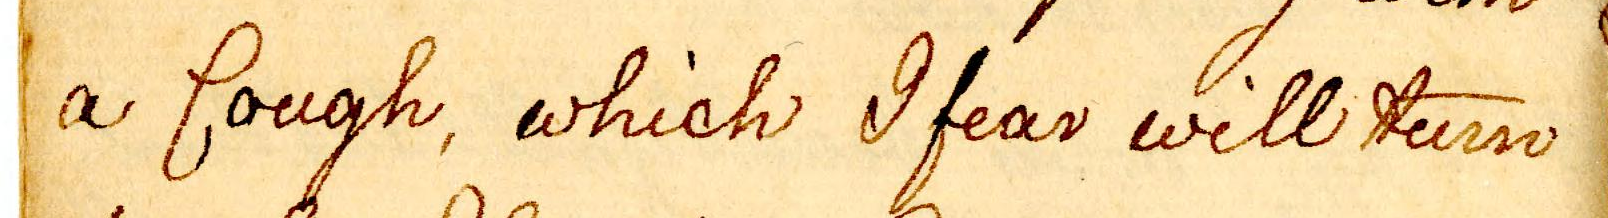a Cough, which I fear will turn
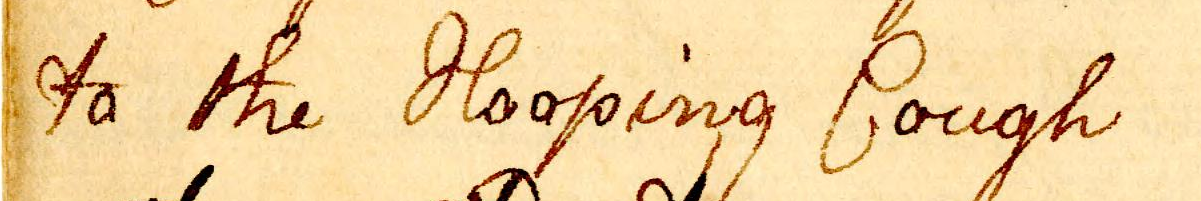to the Hooping Cough
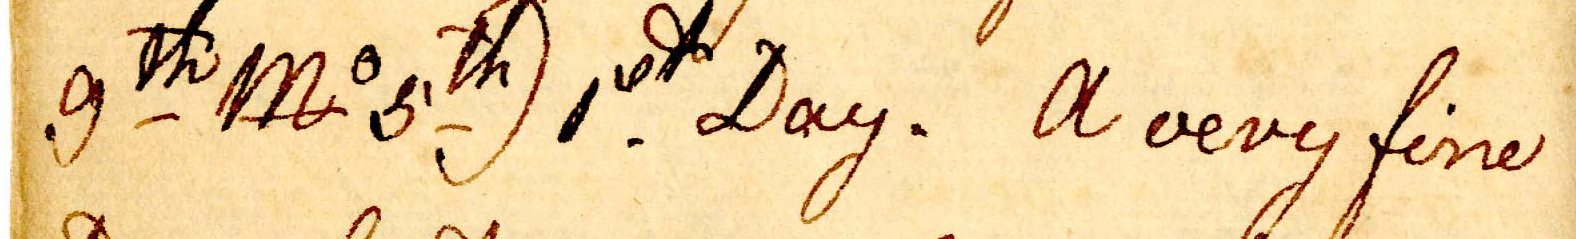9^th M^o 5^th) 1^st Day. A very fine
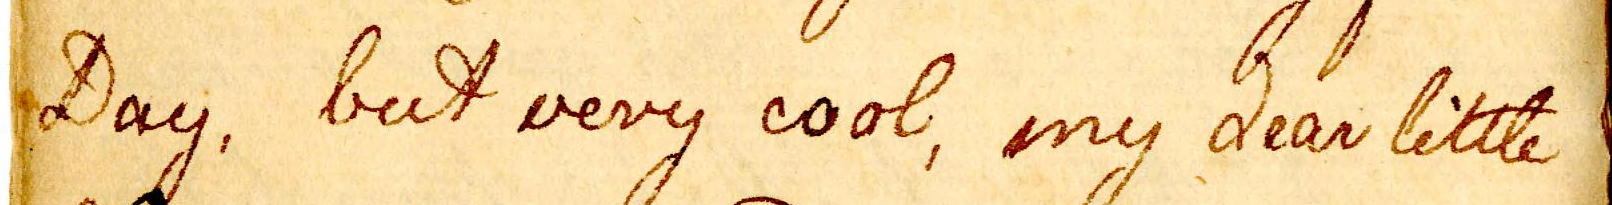Day, but very cool, my dear little
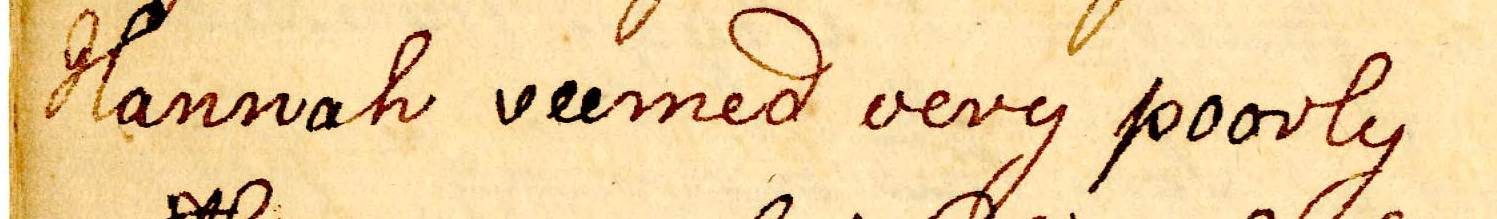Hannah seemed very poorly
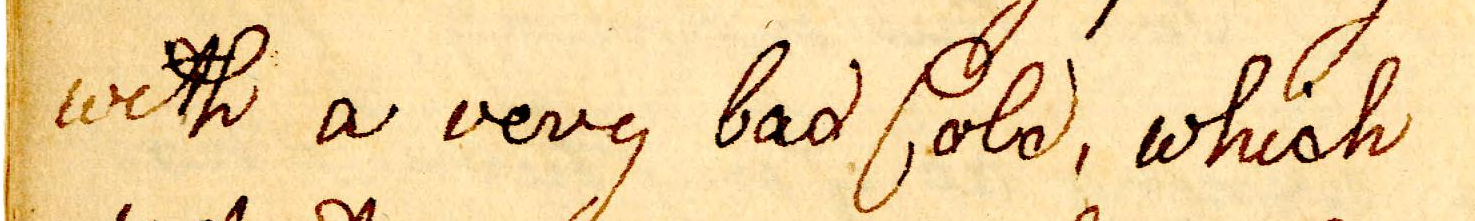with a very bad Cold, which
